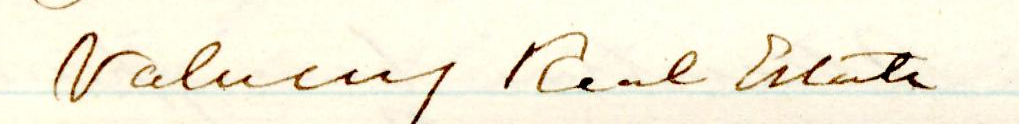Valuing Real Estate
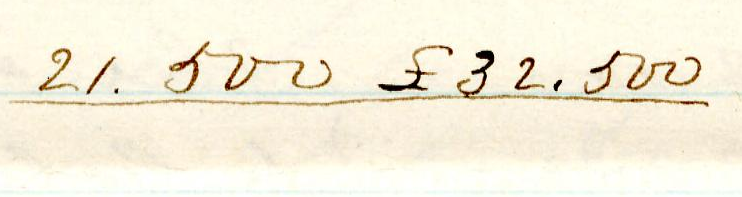21.500 £32.500
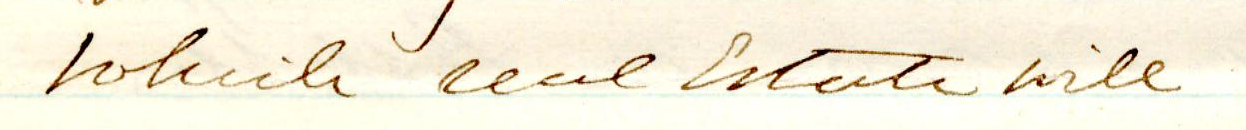Which Real Estate will
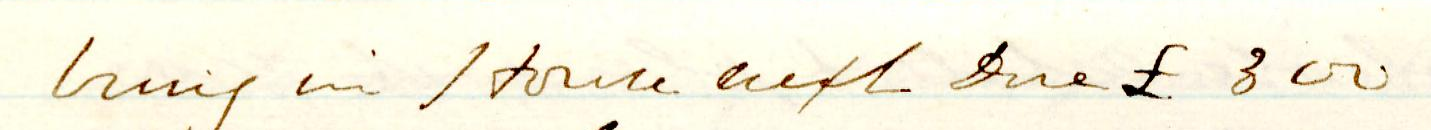bring in start acc^t due £ 800
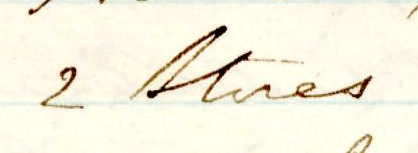2 Stores
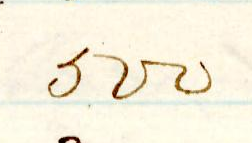500
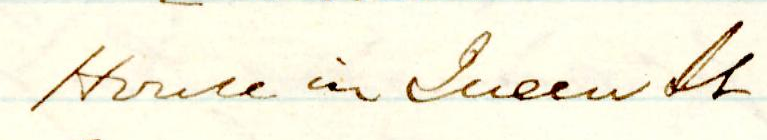House in Queen St
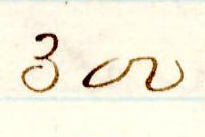300
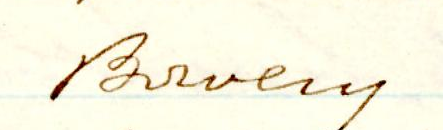Brewery
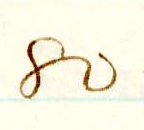80
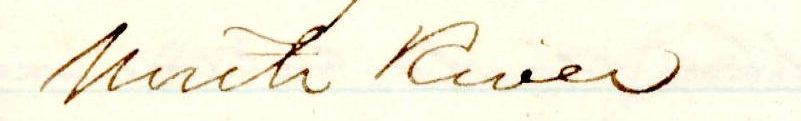North River
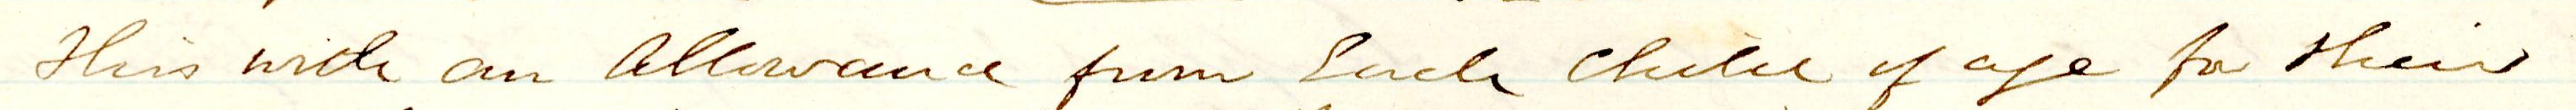This with an Allowance from Each child of age for their
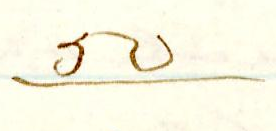50
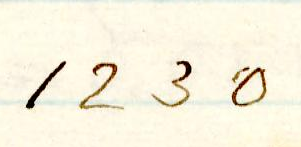1230
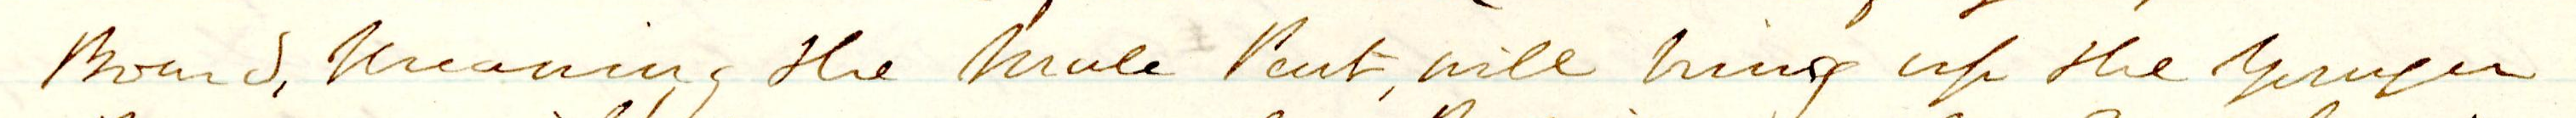Board, recovering the mule Peat, will bring up the younger
